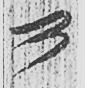乃
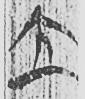立
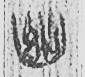幽
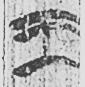王
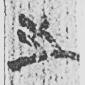之
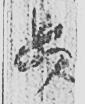弟
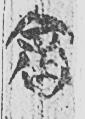{余口}
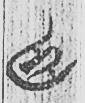臣
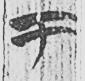于
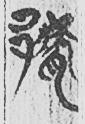{邑寽虎}
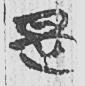是
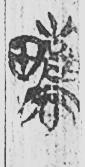{田巂}
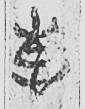惠
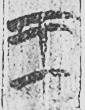王
